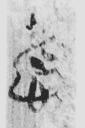惪
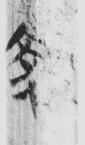執
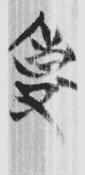事
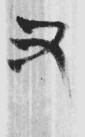又
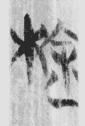梌
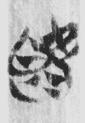既
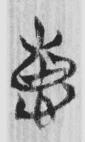惠
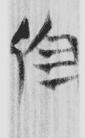於
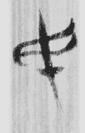民
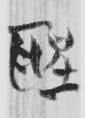聖
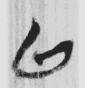㠯（以）
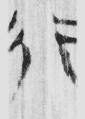行
